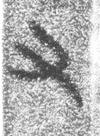又
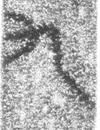九
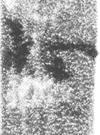柧（虡）
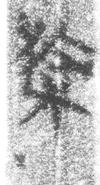○（簨）
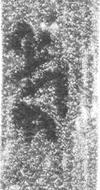厀（漆）
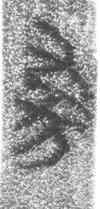○（畫）
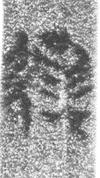緄
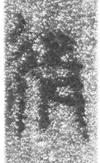維
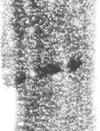一
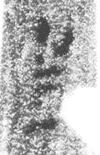彫（雕）
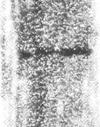一
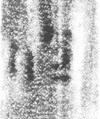竺（築）
